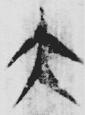大（泰）
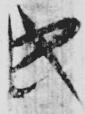女（如）
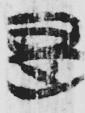是
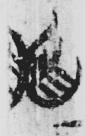○（狀）
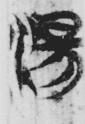湯
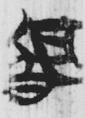○（聞）
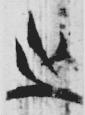之
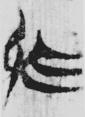於
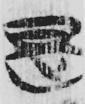是
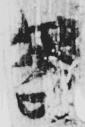唬（乎）
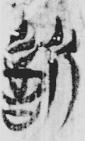○（慎）
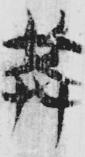戒
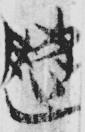○（徵）
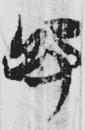臤（賢）
